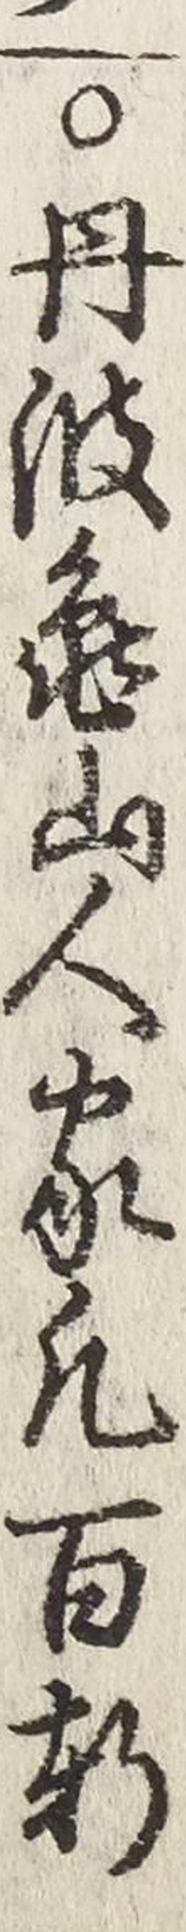○丹波亀山人家凡百軒
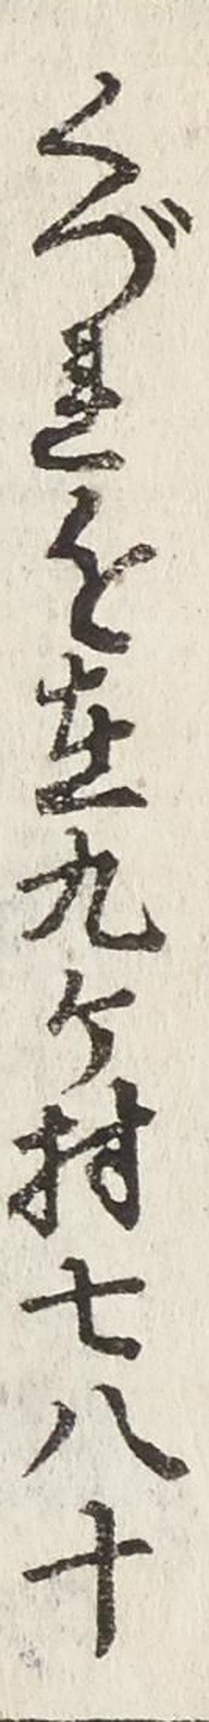くずれ近在九ヶ村七八十
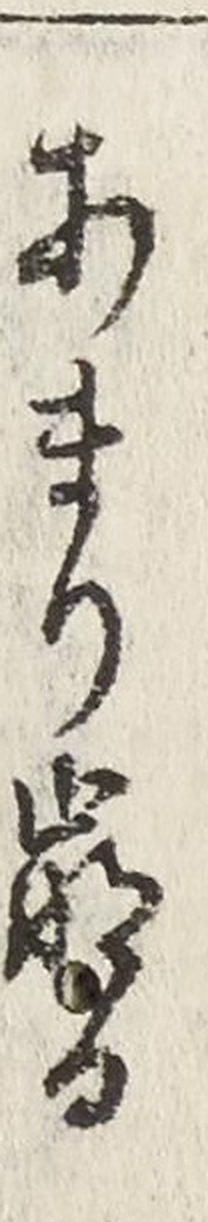あまり崩る
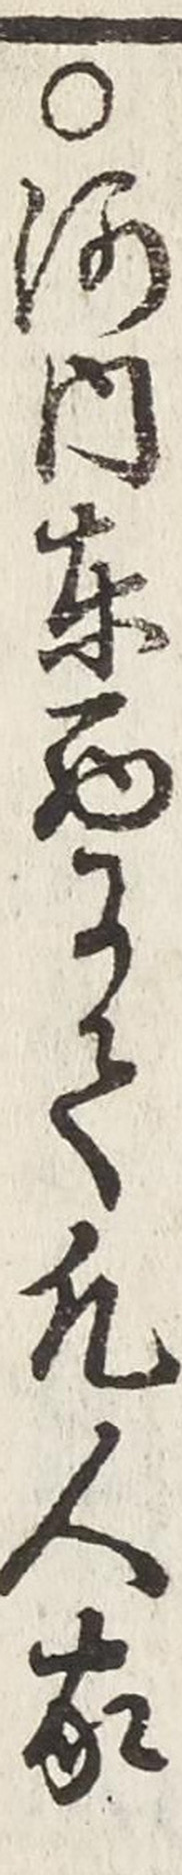○河内東西にて凡人家
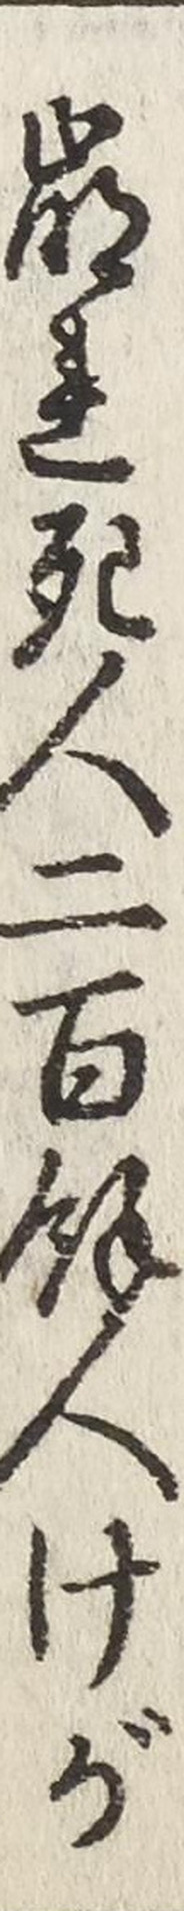崩れ死人二百余人けが
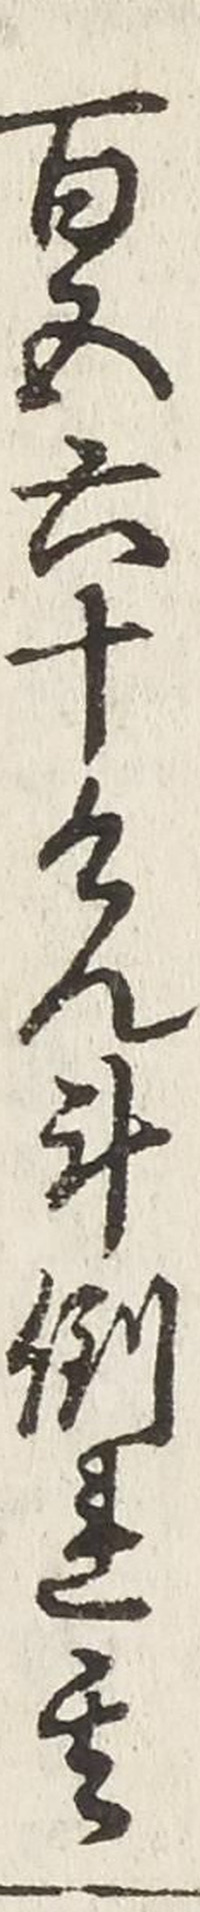百五六十けん計倒れ其
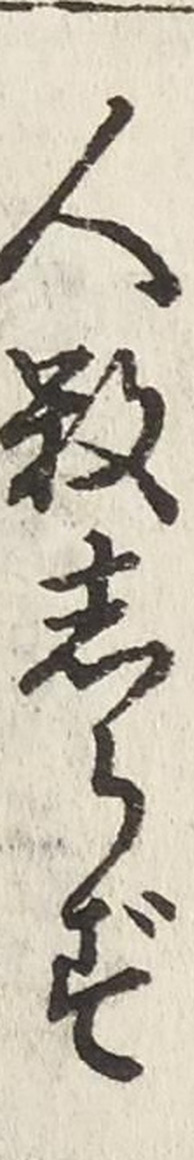人数しらず
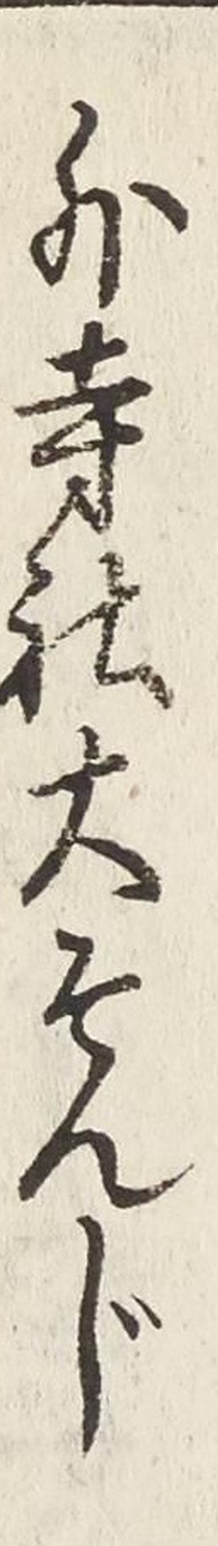外寺社大そんじ
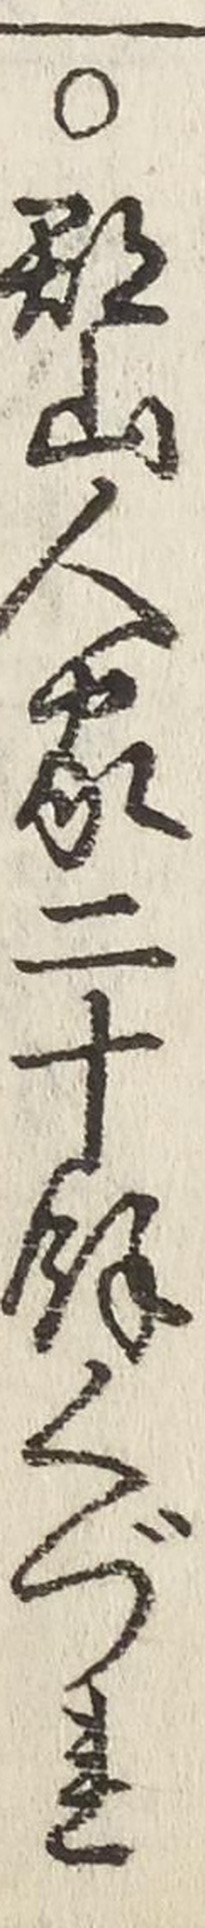○郡山人家二十余くづれ
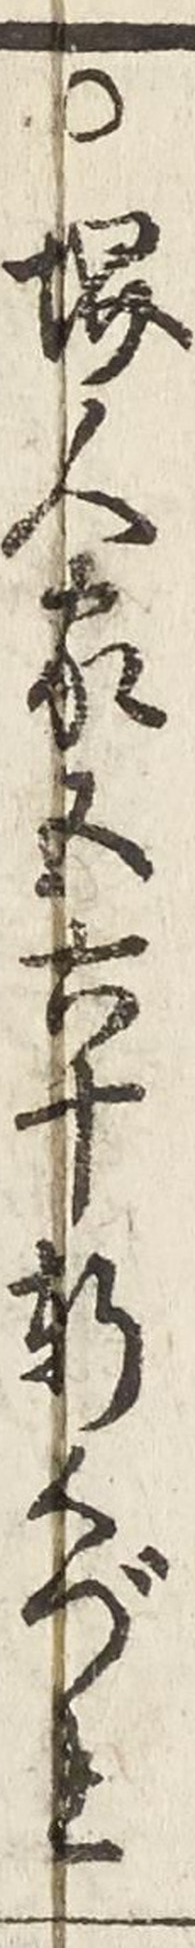○堺人家五六十軒くづれ
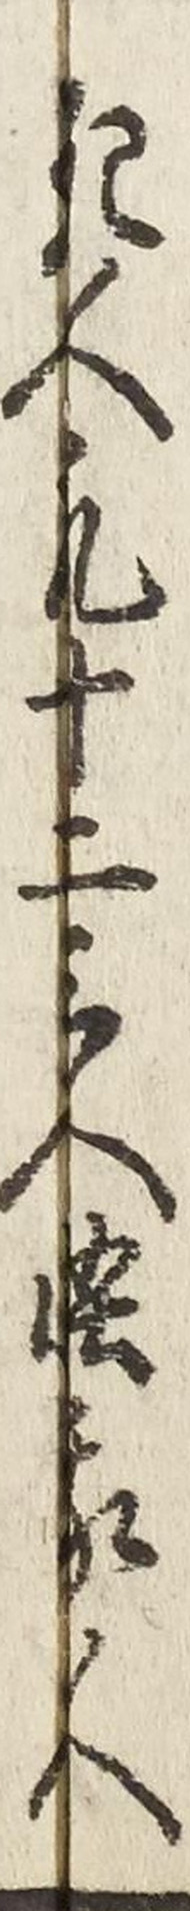死人凡十二三人怪我人
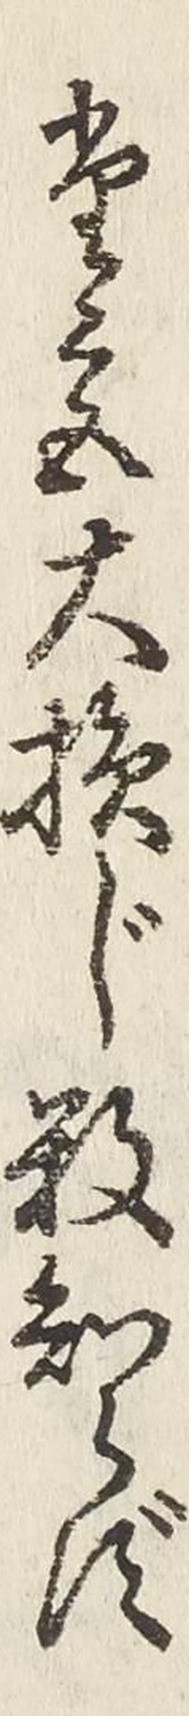堂宮大損じ数知らず
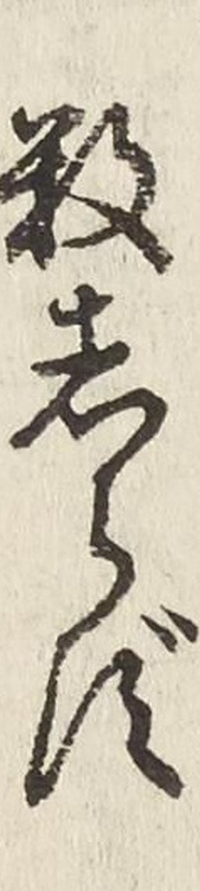数しらず
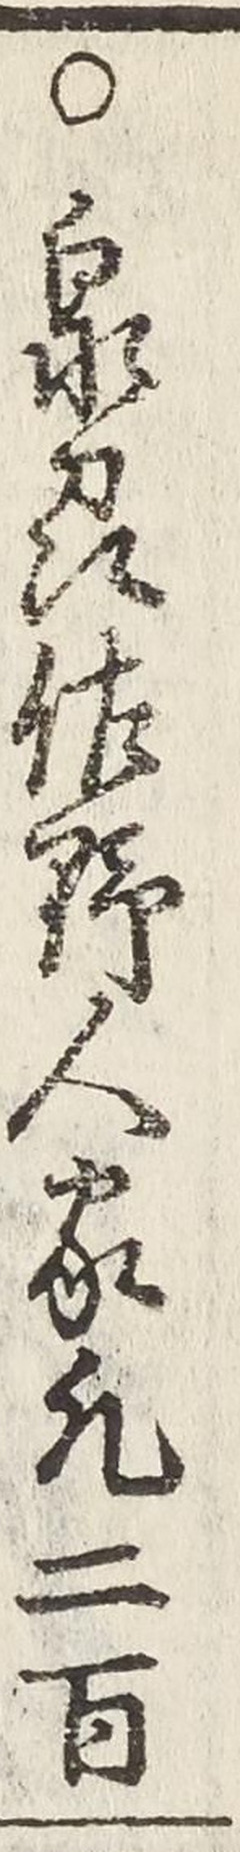○泉州佐野人家凡二百
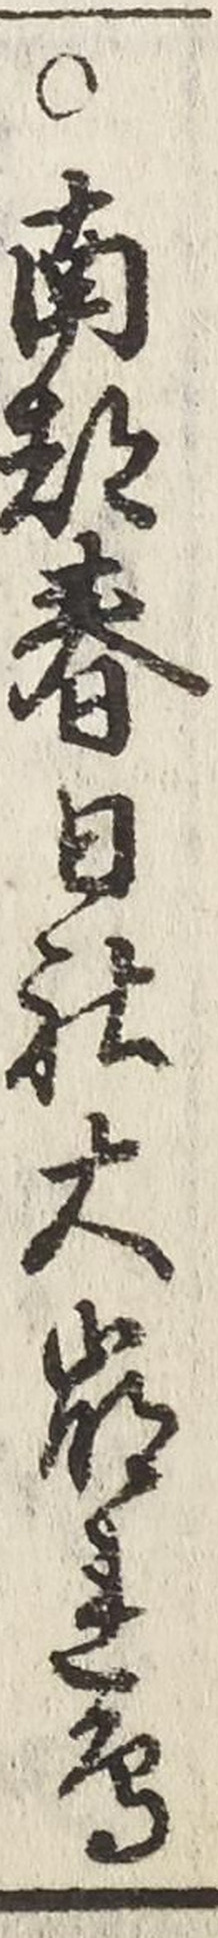○南都春日社大崩れ鳥
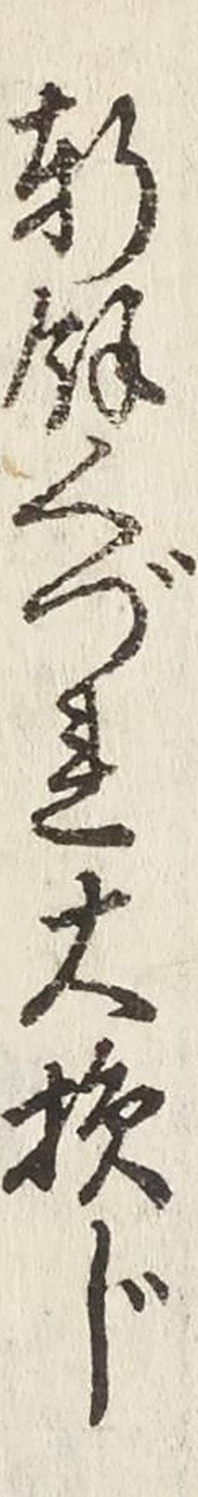軒余くづれ大損じ
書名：大地震大津浪末代噺種　（二編　全）
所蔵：東京大学地震研究所図書室 Earthquake Research Institute Library, The University of Tokyo, JAPAN
